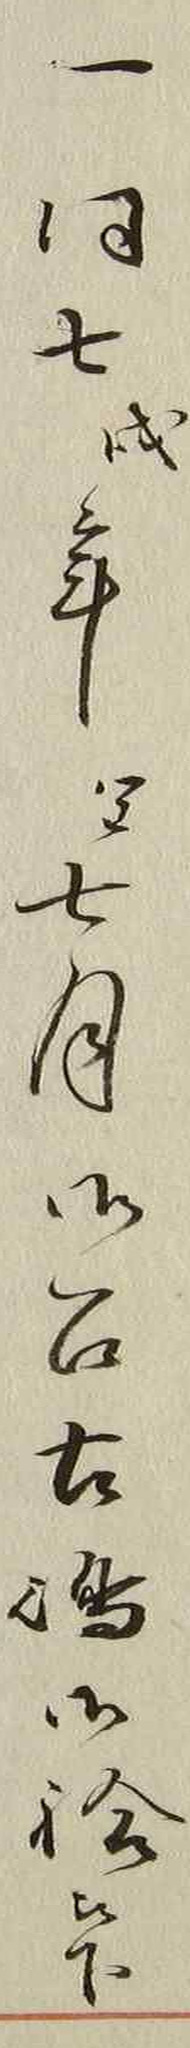一同七戌年閏七月御召古嶋御袷被下
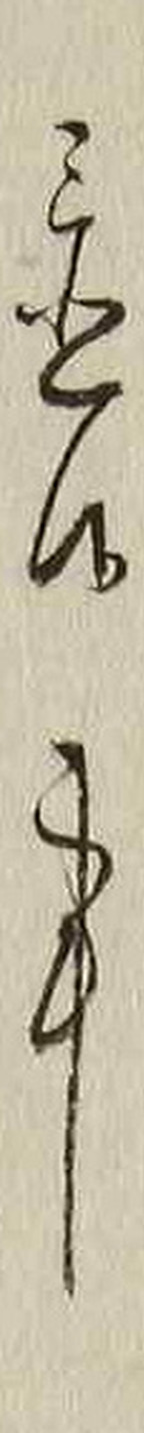置候事
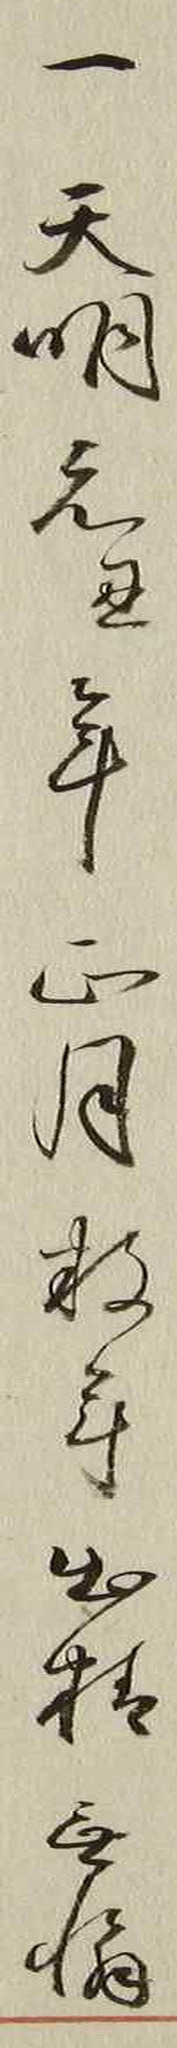一天明元丑年正月数年出精無懈
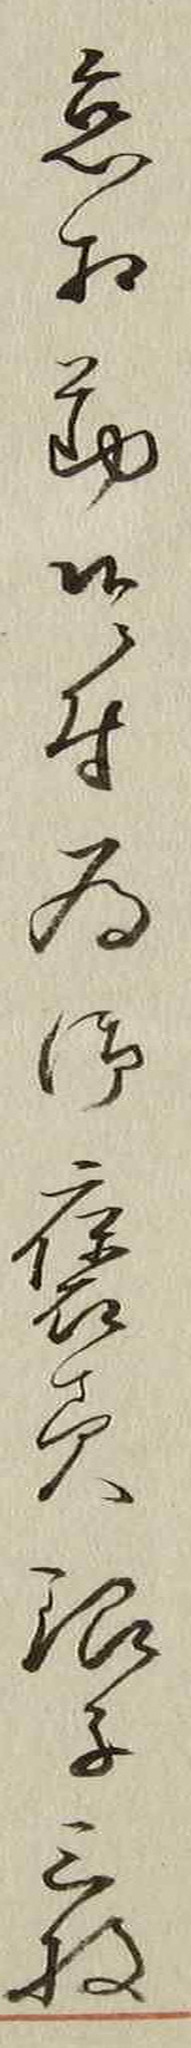怠相勤候ニ付為御褒美銀子三枚
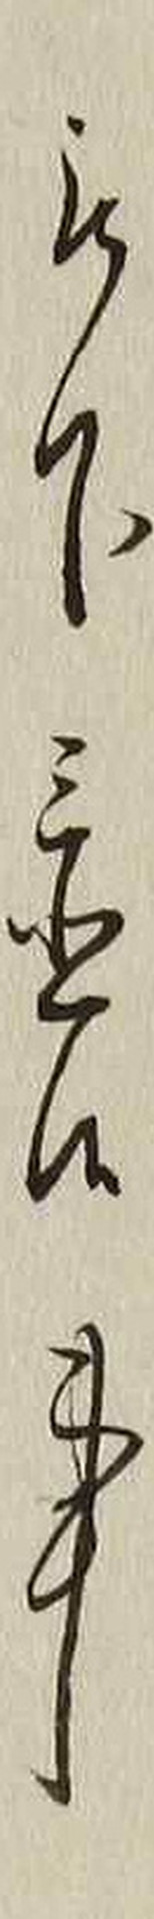被下置候事
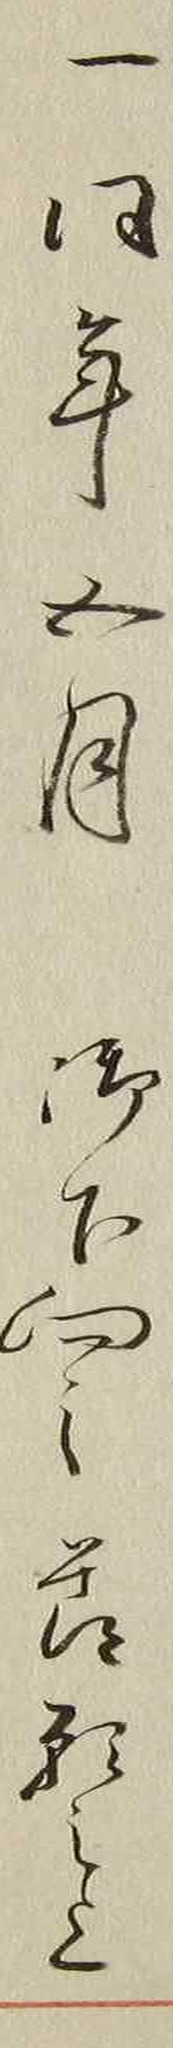一同年五月御下向之節願之上
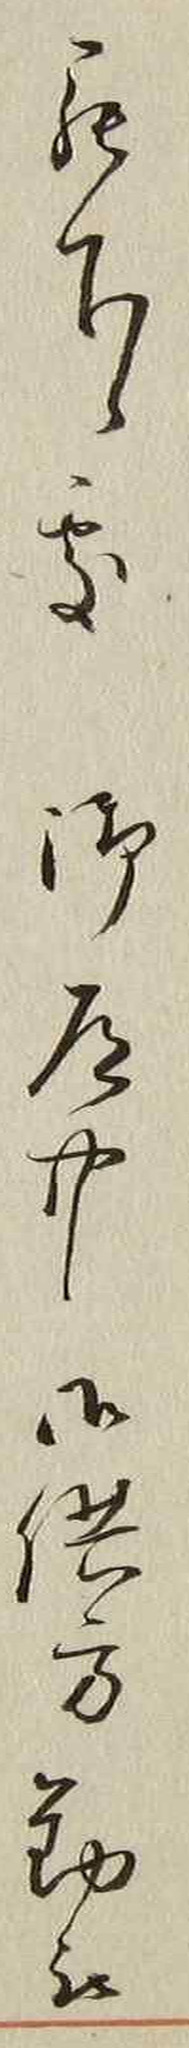罷下候処御道中御供方勤被
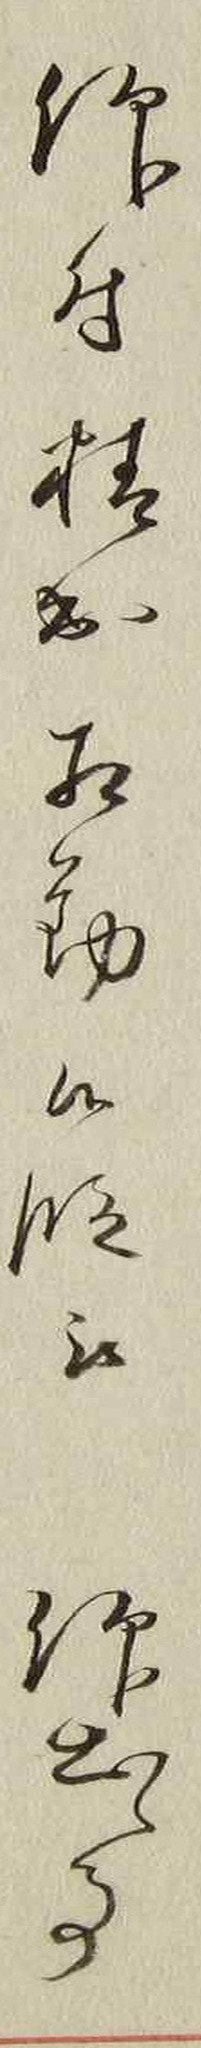仰付精出相勤候段被仰出候事
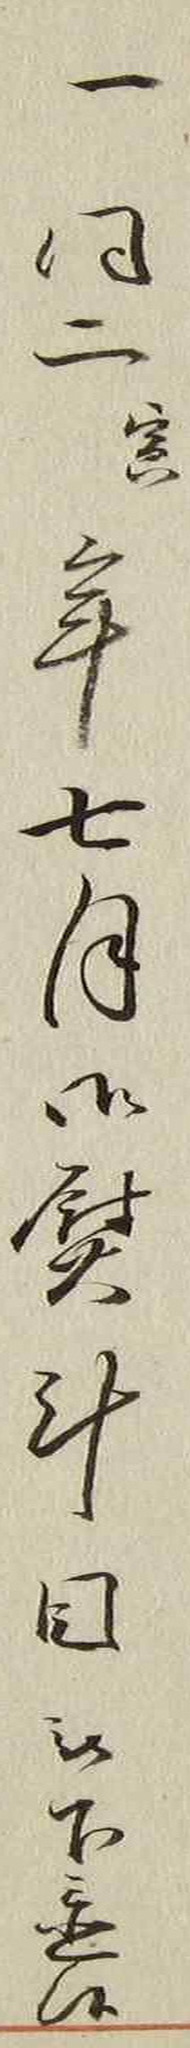一同二寅年七月御熨斗目被下置候
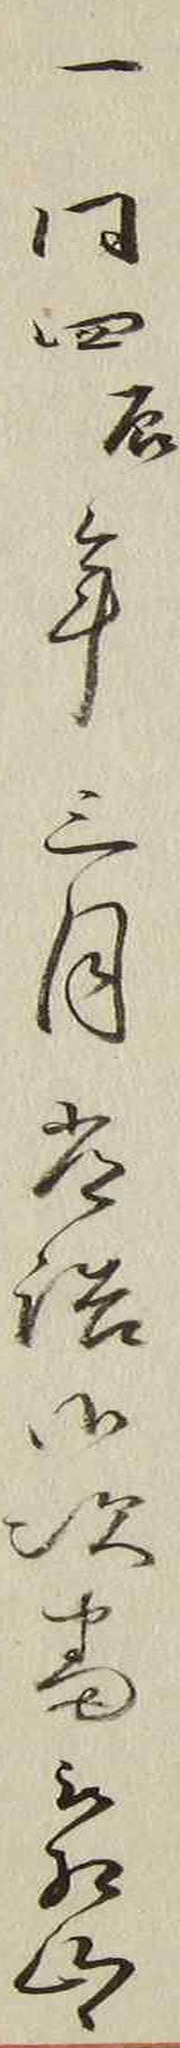一同四辰年三月常詰御次番被相止候
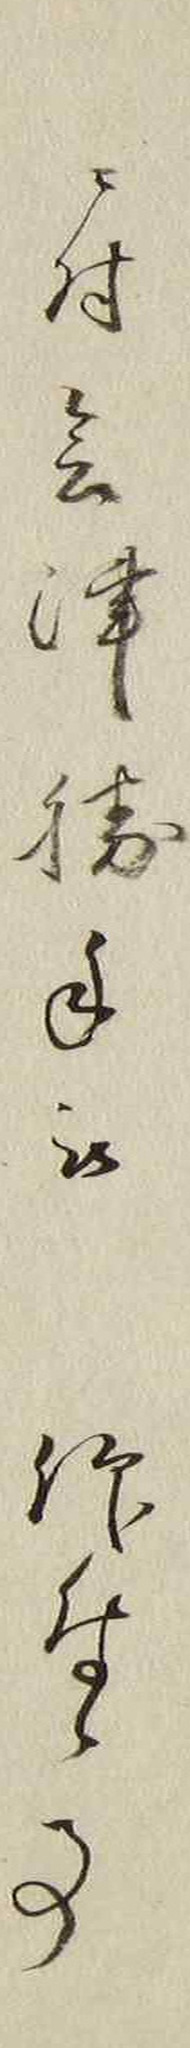ニ付会津勝手被仰付候事
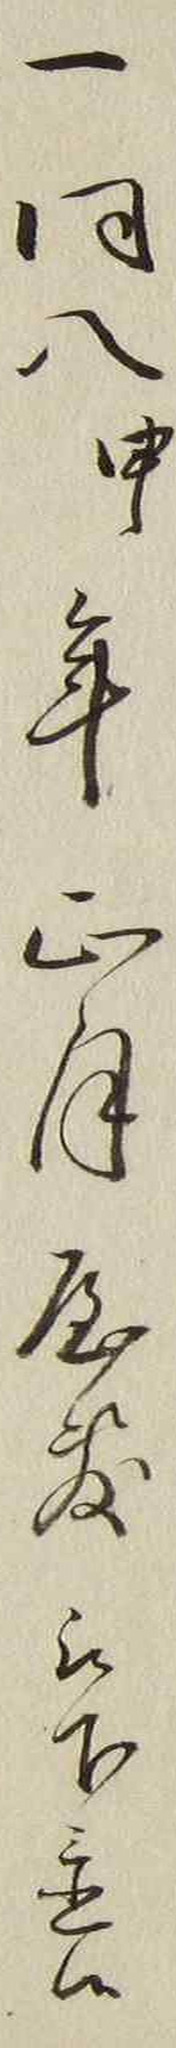一同八申年正月屋敷被下置候

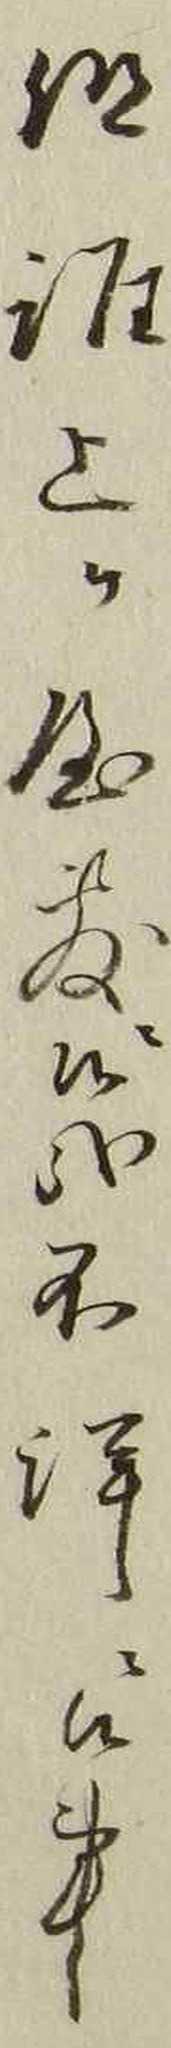但誰上ケ屋敷ニ候哉不詳ニ候事
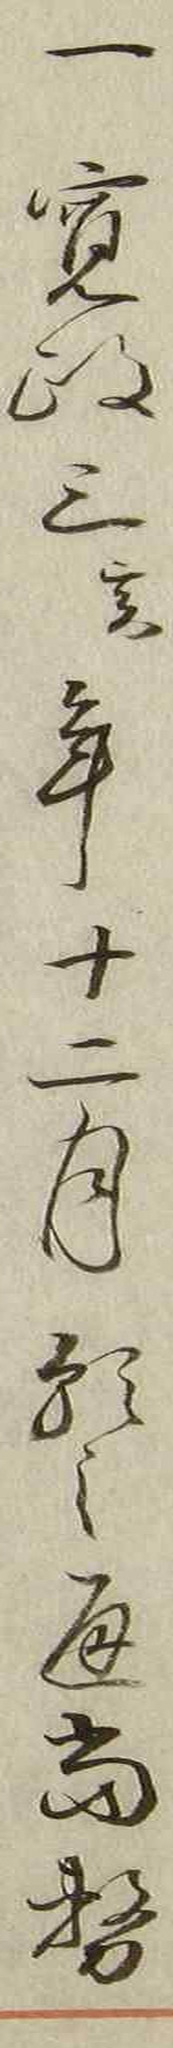一寛政三亥年十二月願之通当務
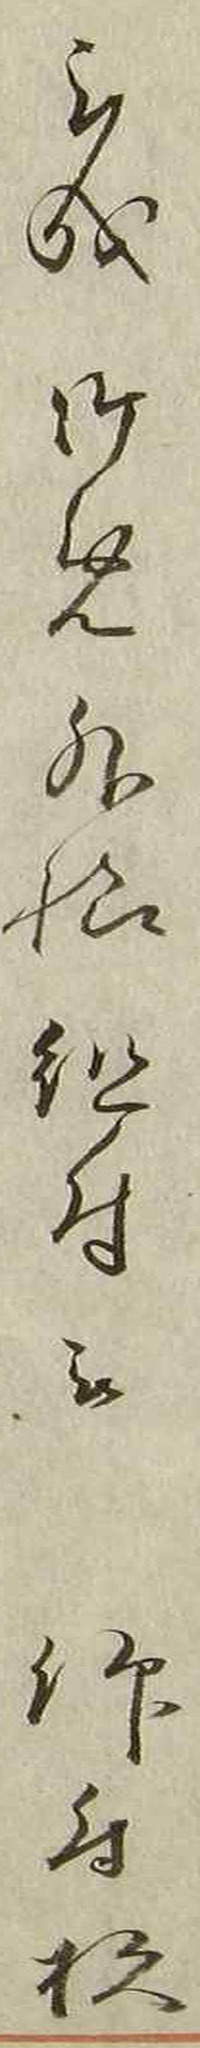被成御免外様組付被仰付杉
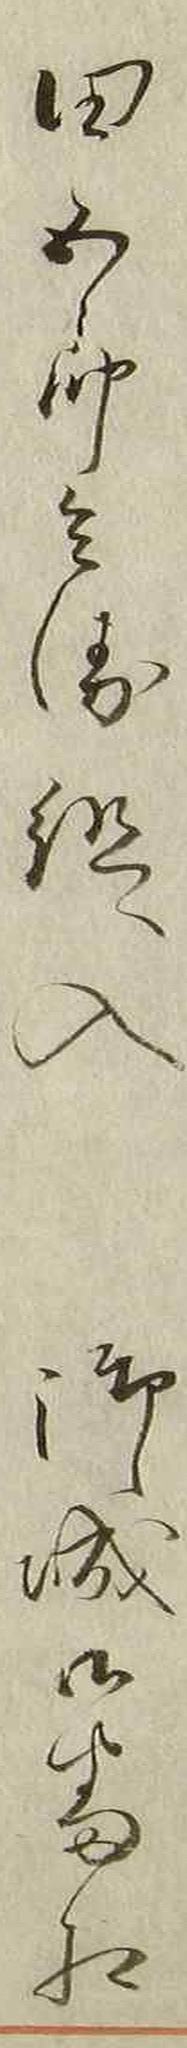田五郎兵衛組へ入御城御番相
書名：諸士系譜　巻之28　い之部28
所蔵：会津若松市立会津図書館
